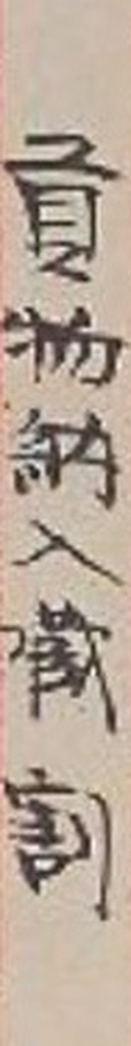貢物納入蔵割
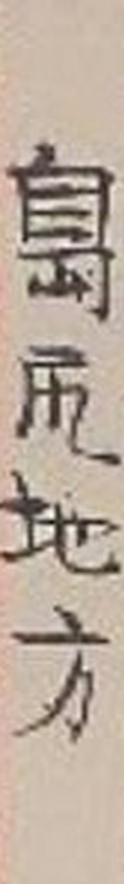島尻地方
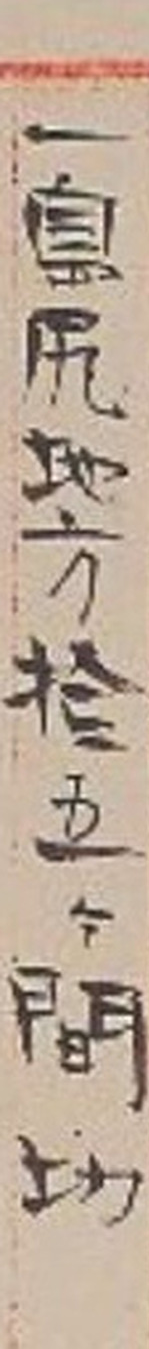一島尻地方拾五ヶ間切
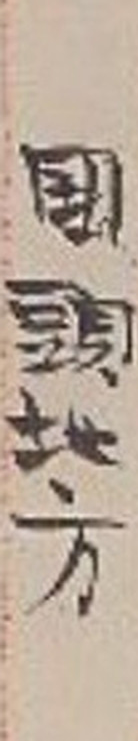国頭地方
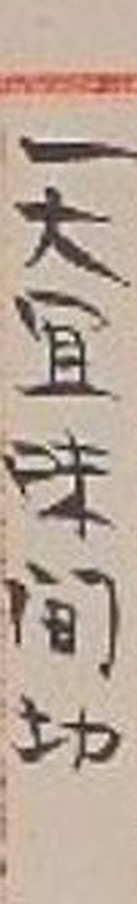一大宜味間切
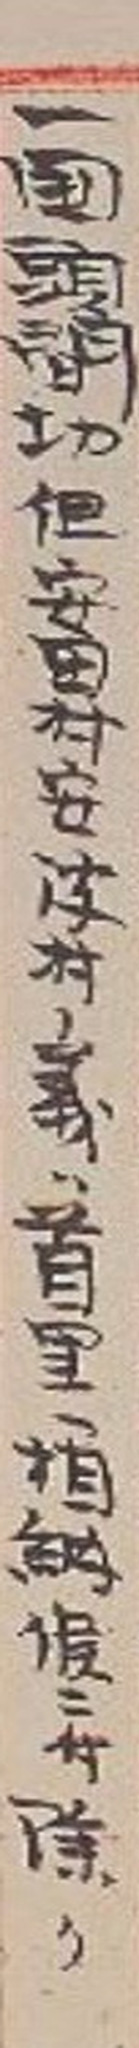一国頭間切但安田村安波村ノ義ハ首里ヘ相納候ニ付除ク
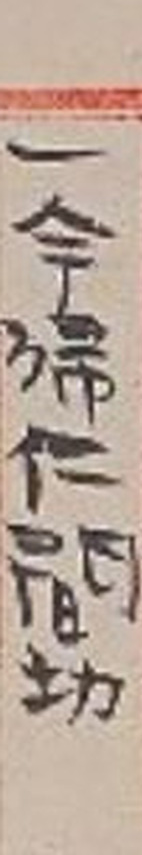一今帰仁間切
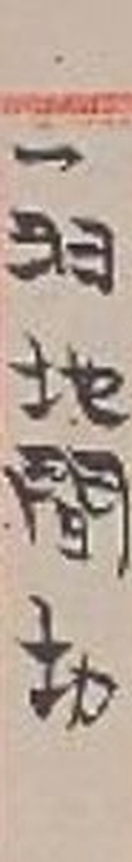一羽地間切
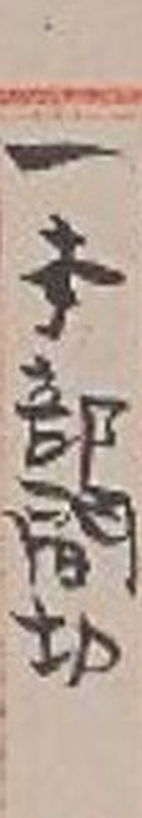一本部間切
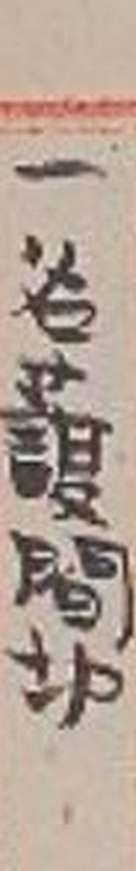一名護間切

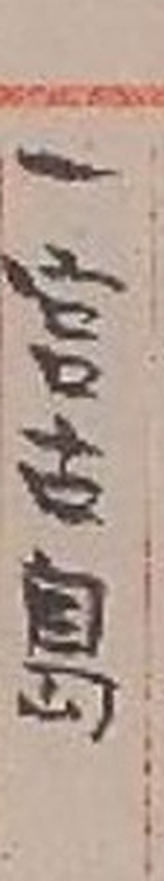一宮古島
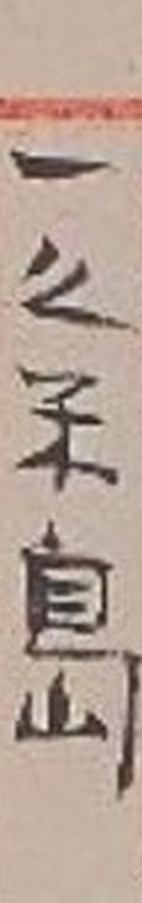一久米島
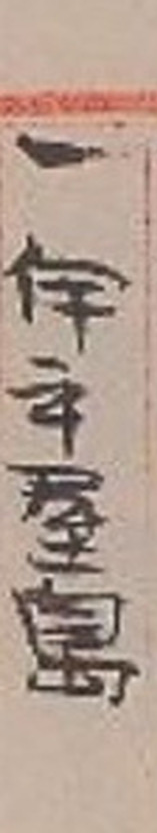一伊平屋島
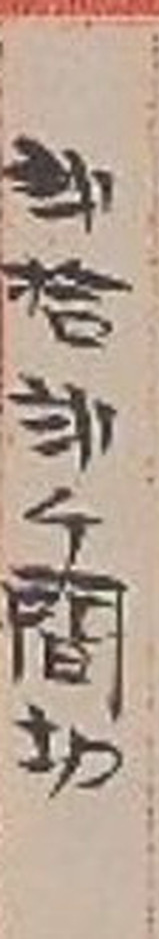弐拾弐ヶ間切
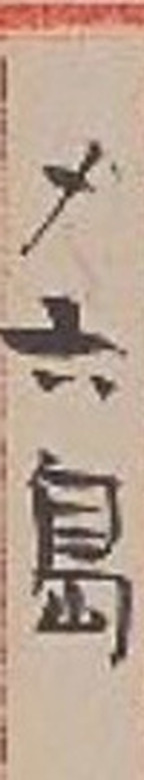〆六島
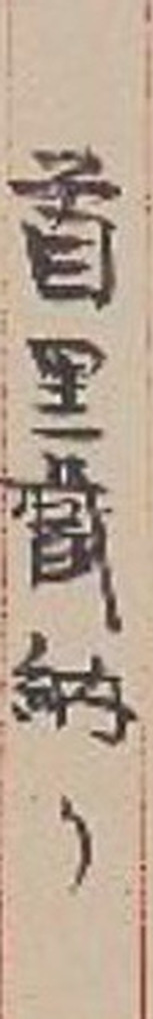首里蔵納リ
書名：貢納物品領収旧藩慣例並ニ置県後取扱順序
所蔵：University of the Ryukyus Library
